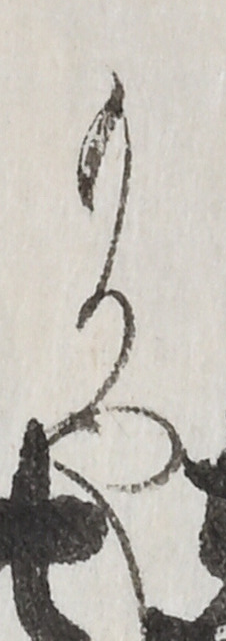もかや
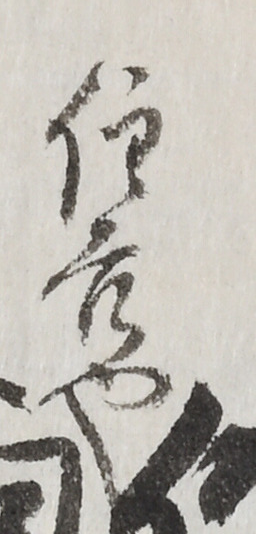住吉や

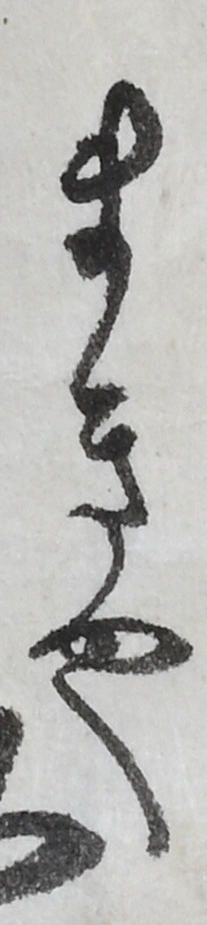まきや
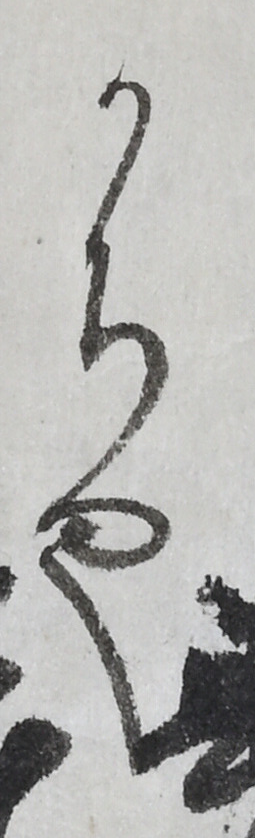かちや
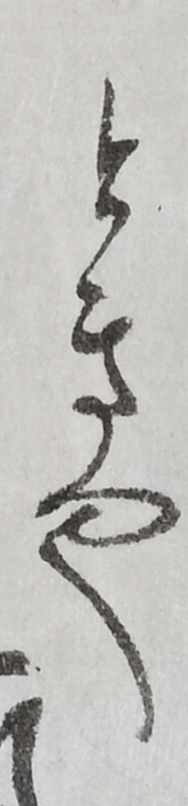ときや
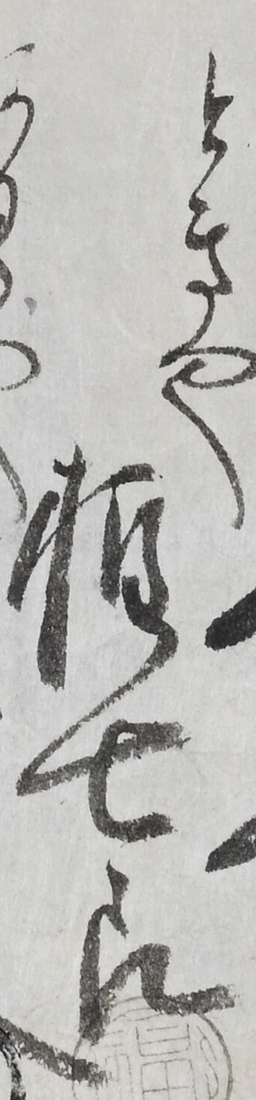ときや
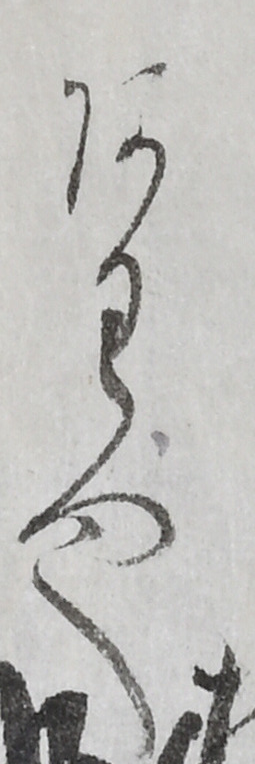あわや
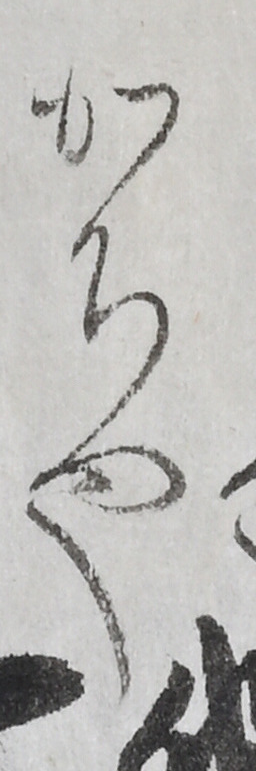かちや
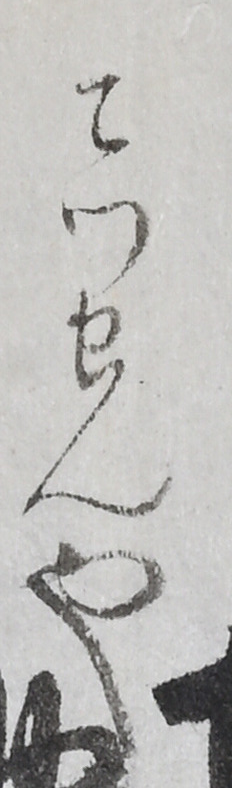てつせんや
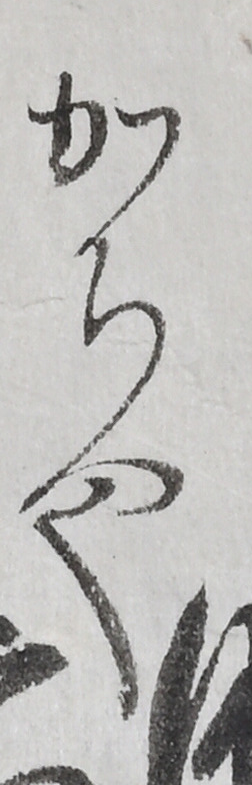かちや
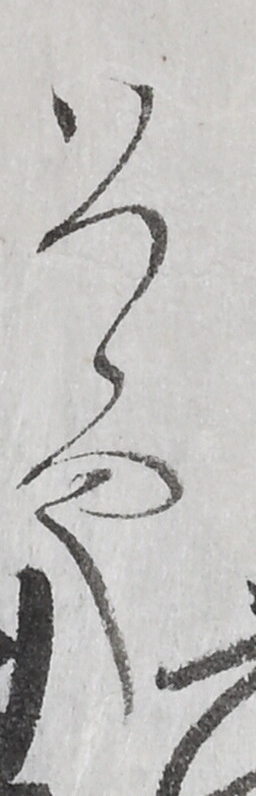いつゝや
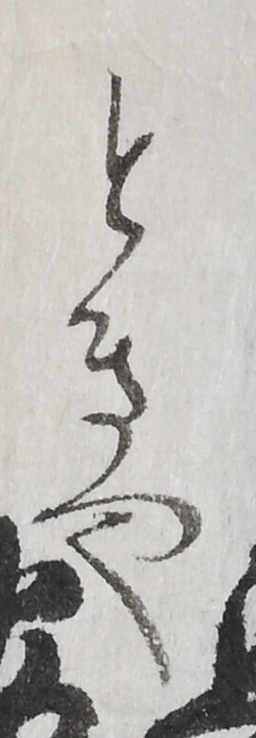ときや
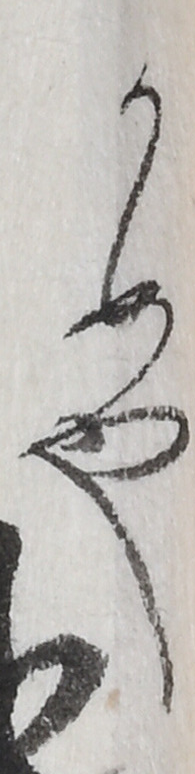かめや
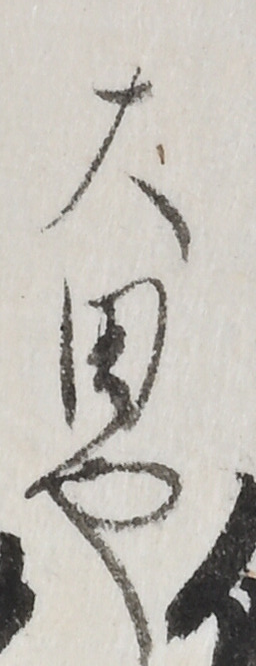大田や
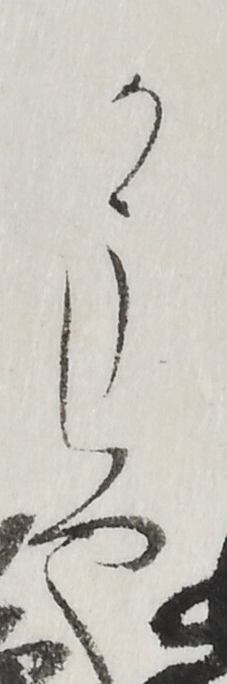かうしや
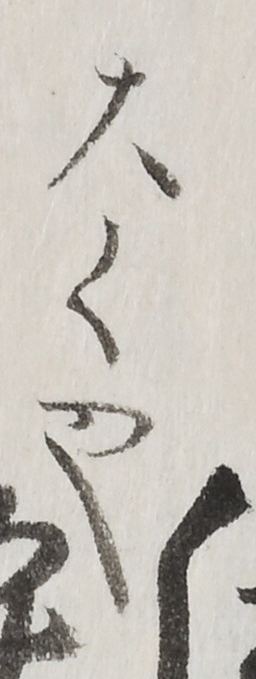大くや
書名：當町火消道具幷役付帳
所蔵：伊那市立高遠町図書館・合同会社AMANE
